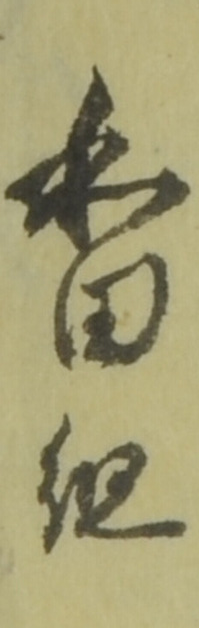和田組

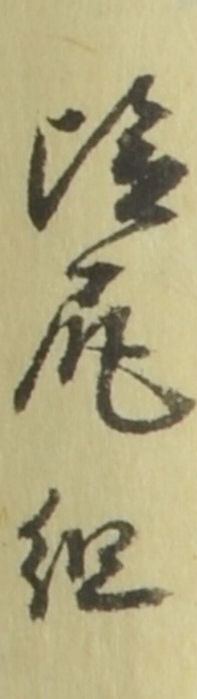塩尻組
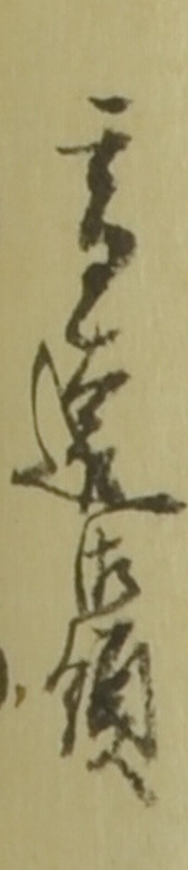高遠御領
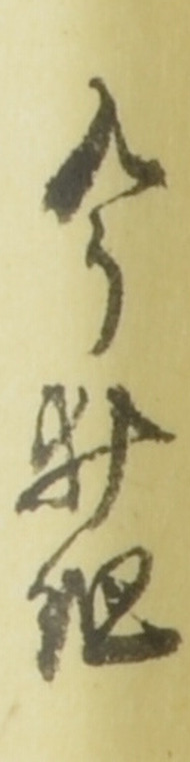今井組
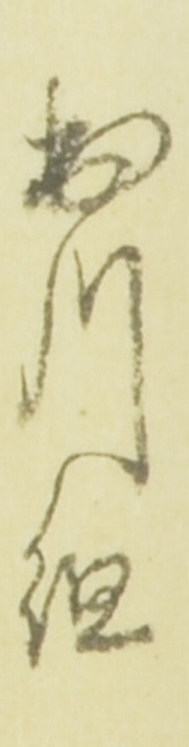出川組
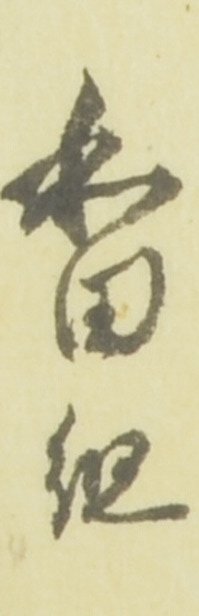和田組
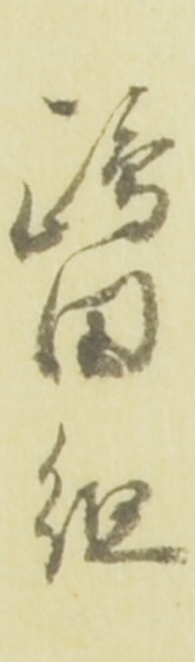嶋田組
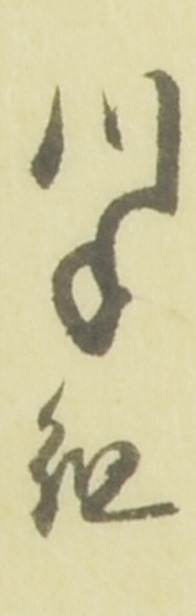川手組
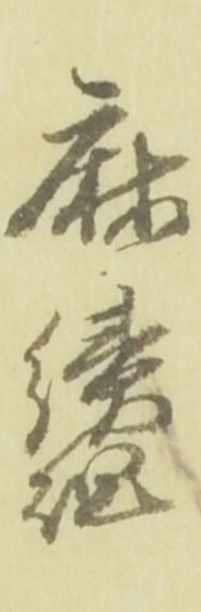麻積組
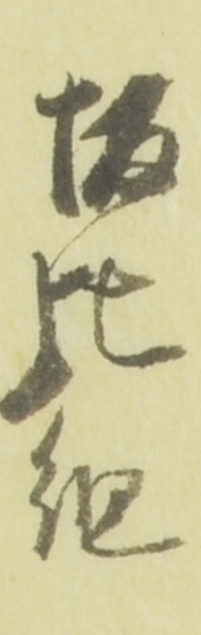坂比組
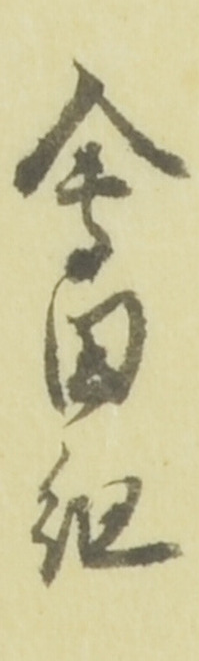会田組
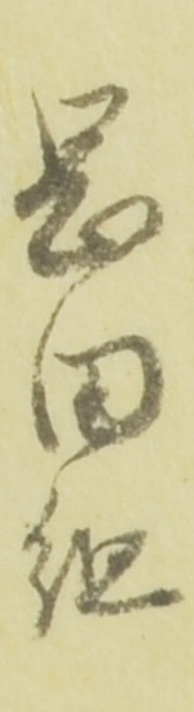岡田組
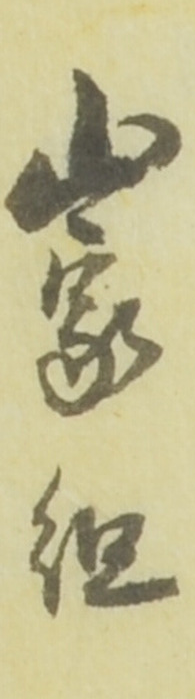山家組
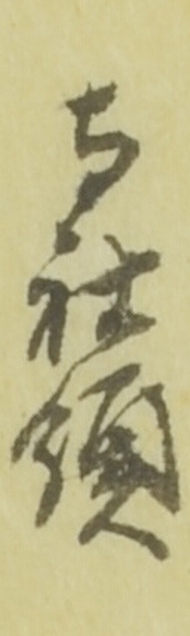寺社領
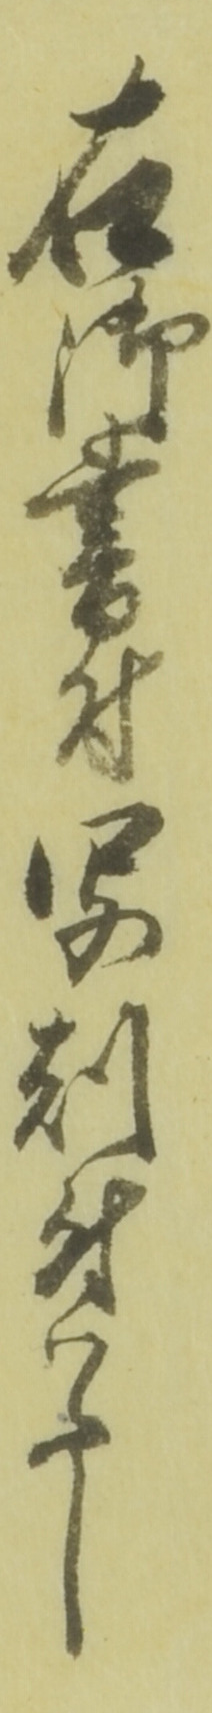右御書付写刻付いたし
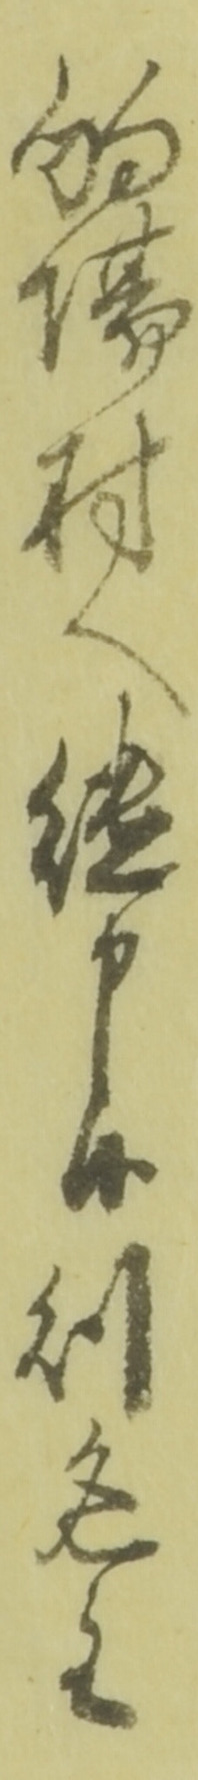的場村へ継申候則名主
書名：御触書御書附控
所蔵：伊那市立高遠町図書館・合同会社AMANE
